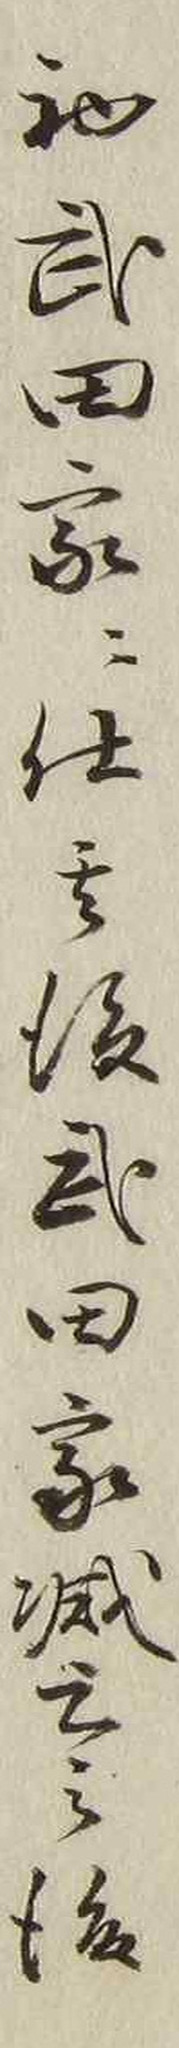初武田家に仕其後武田家滅亡之後
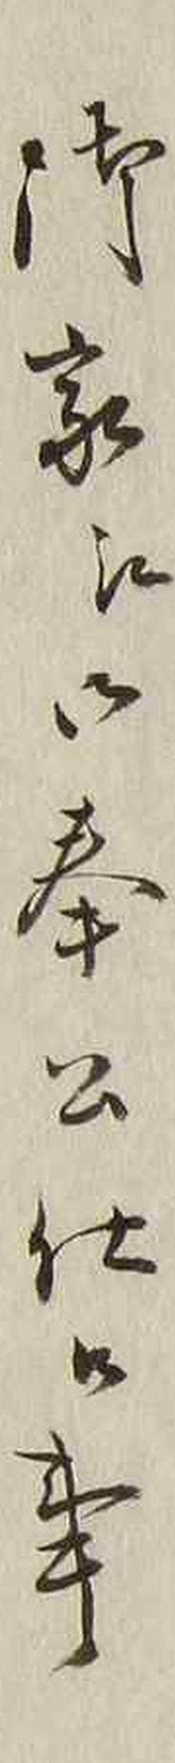御家え御奉公仕候事

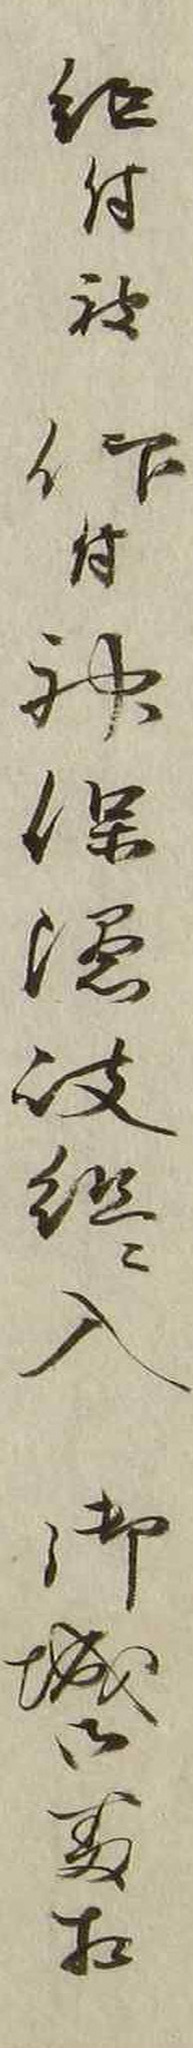組付被仰付神保隠岐組に入御城御番相
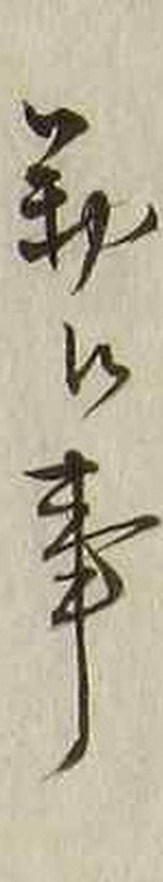勤候事
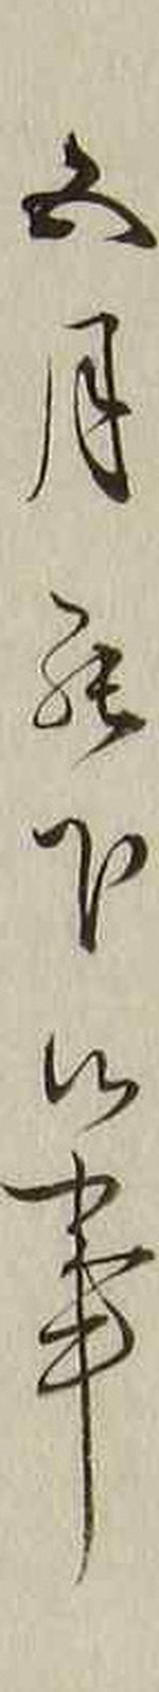五月罷下候事
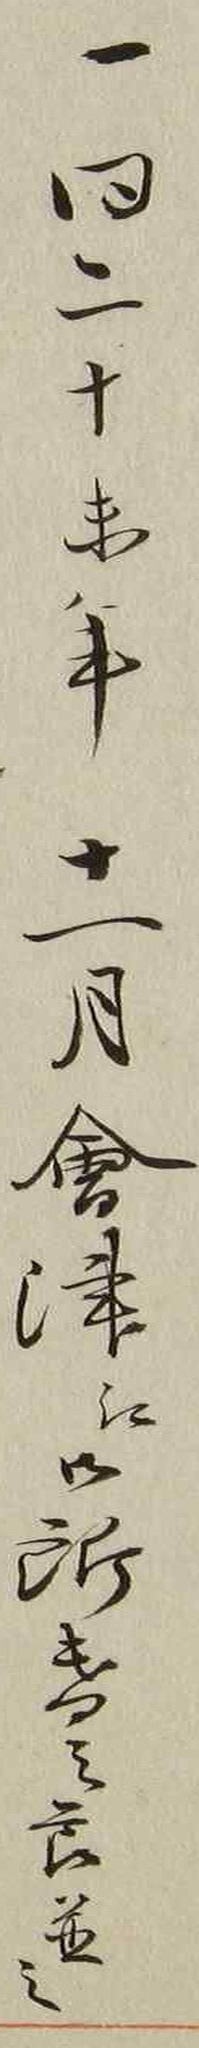一同二十未年十一月会津え御所替之節並之
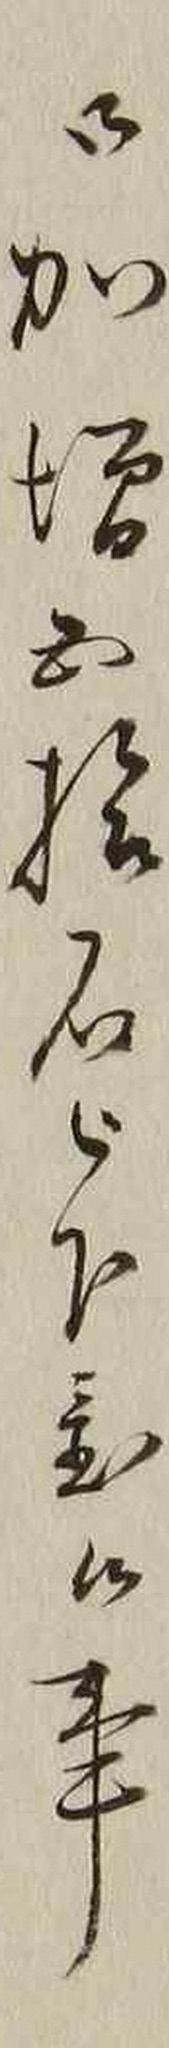御加増五拾石被下置候事
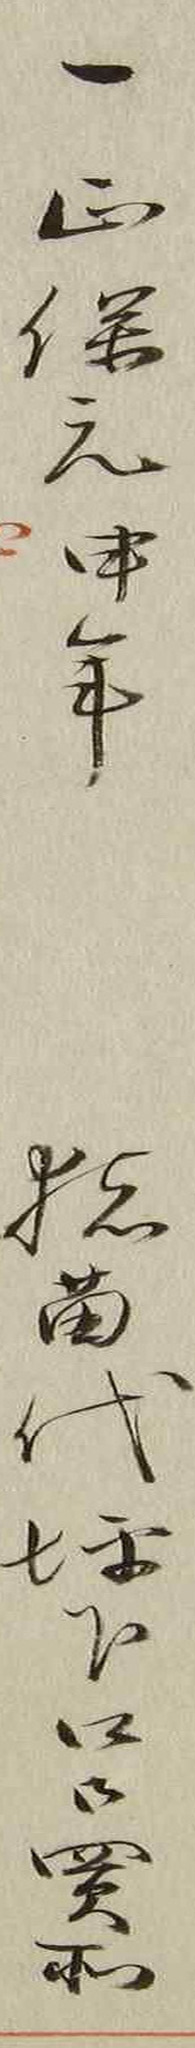一正保元申年猪苗代坪下口御関所
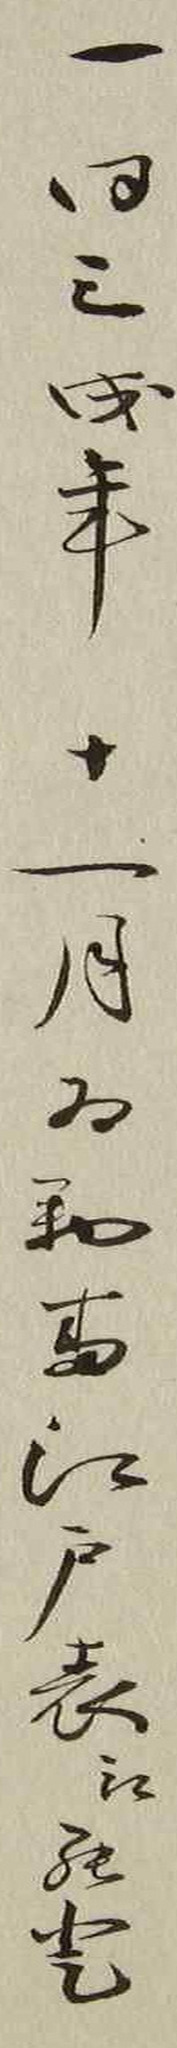一同三戌年十一月為勤番江戸表え罷登
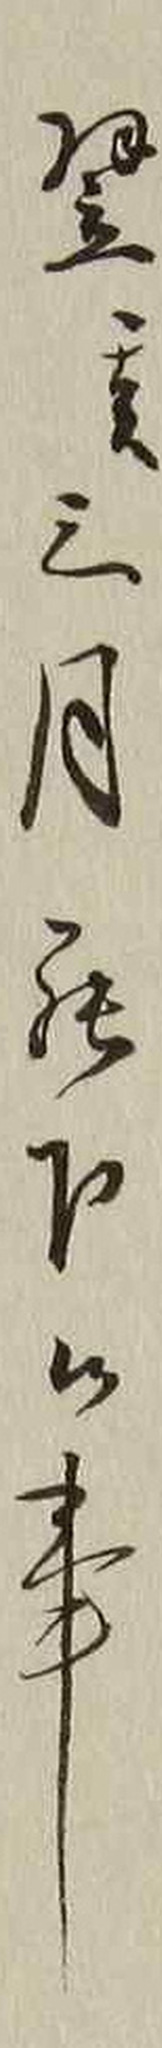翌亥三月罷下候事
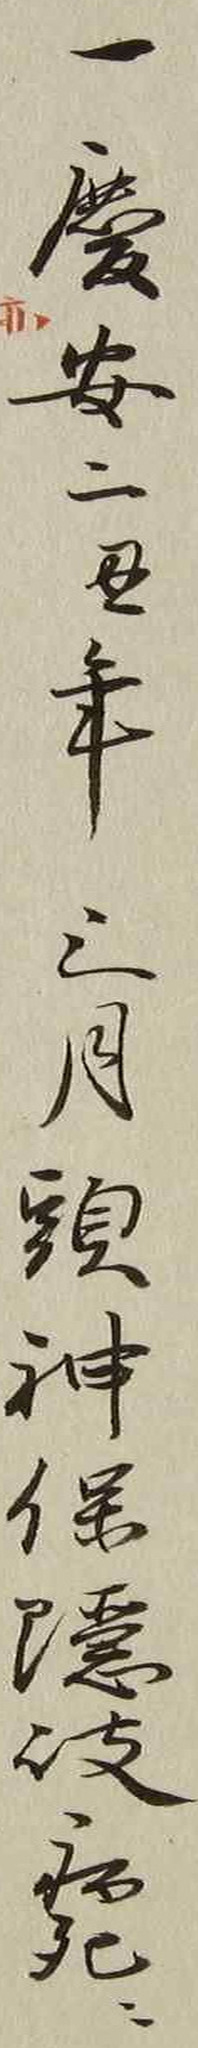一慶安二丑年三月頭神保隠岐病死に
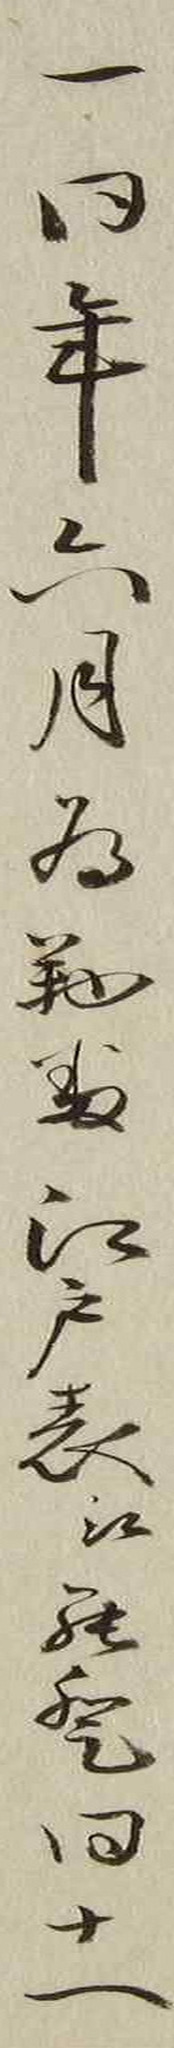一同年六月為勤番江戸表え罷登同十一
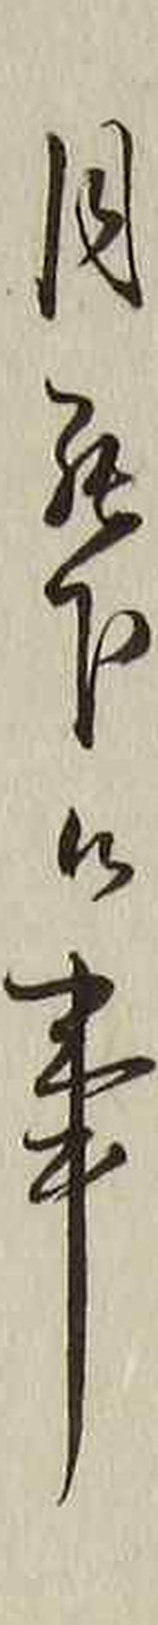月罷下候事
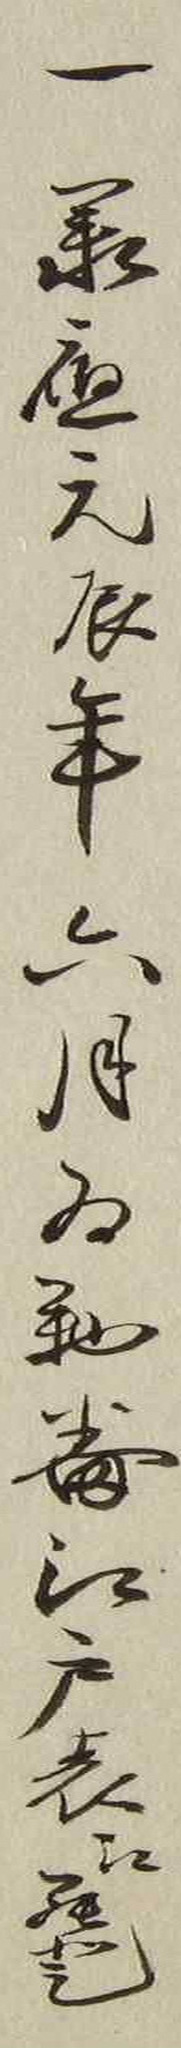一承応元辰年六月為勤番江戸表え罷登
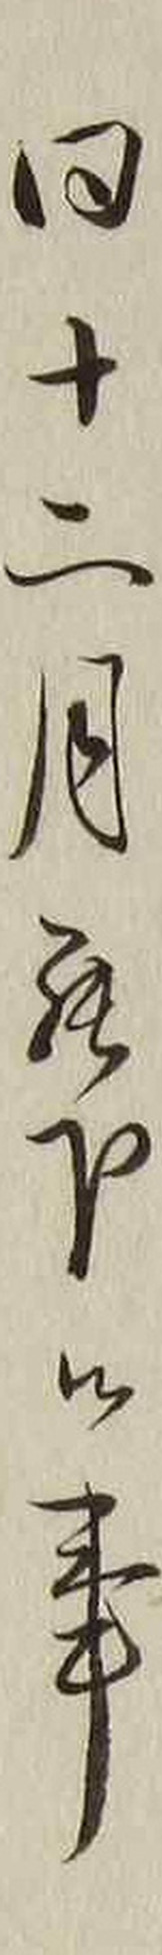同十二月罷下候事
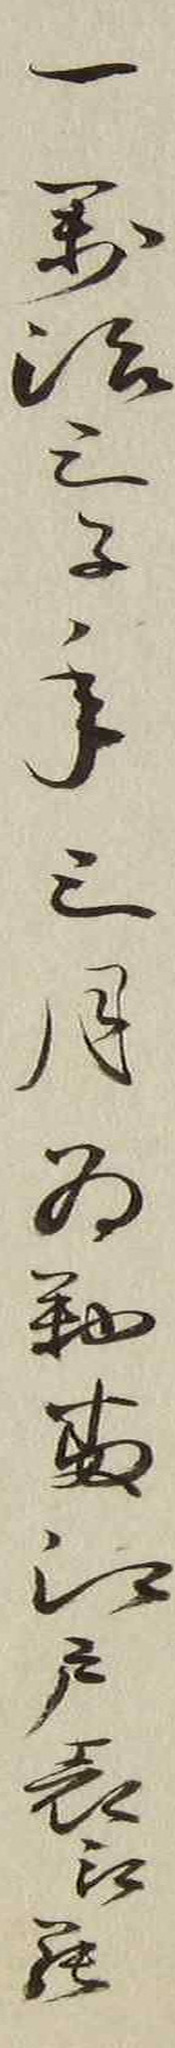一万治三子年三月為勤番江戸表え罷
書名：諸士系譜　巻之157　ね之部1
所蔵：会津若松市立会津図書館
